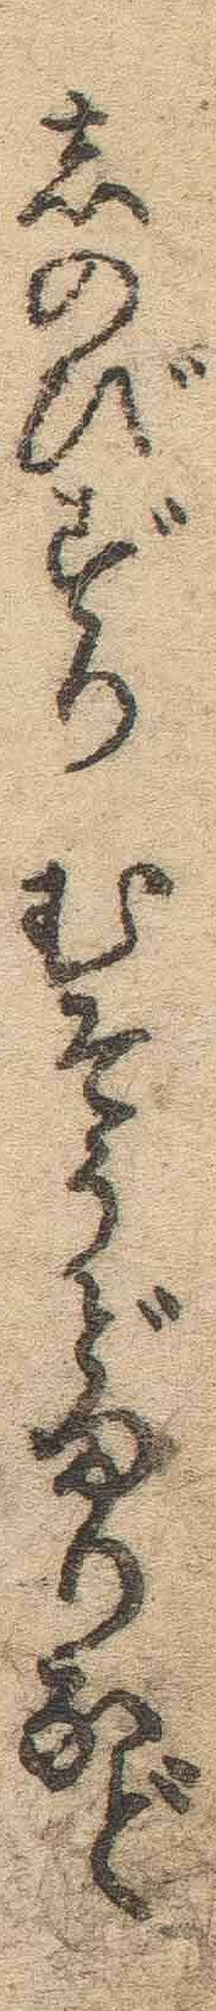しのびぞりむそうどまりなど
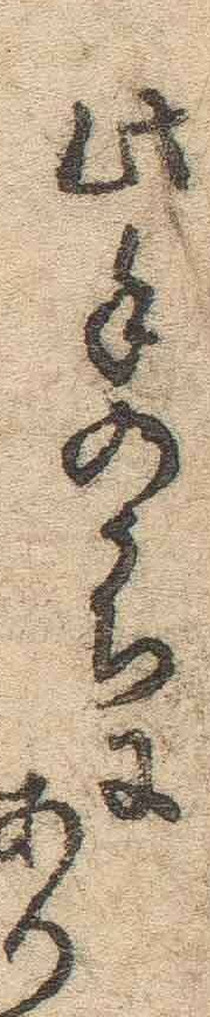此手のうちにあり
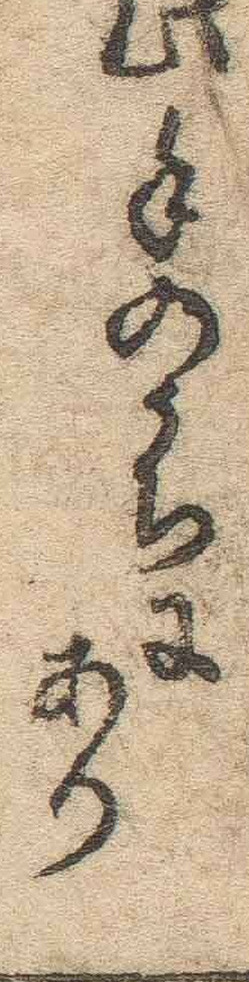此手のうちにあり
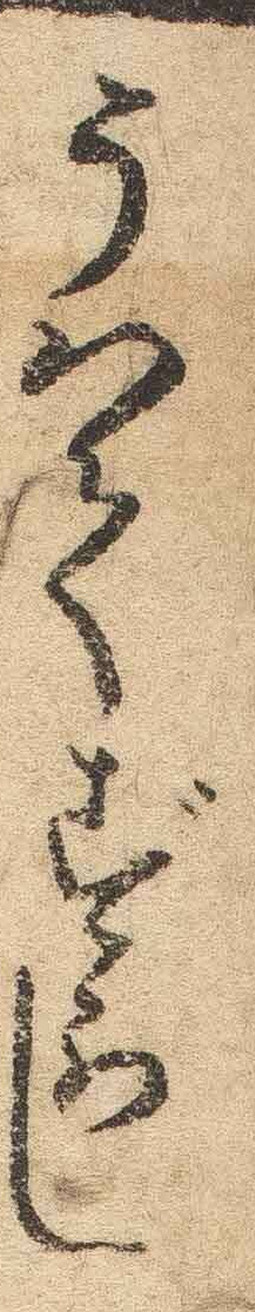うはてずらし
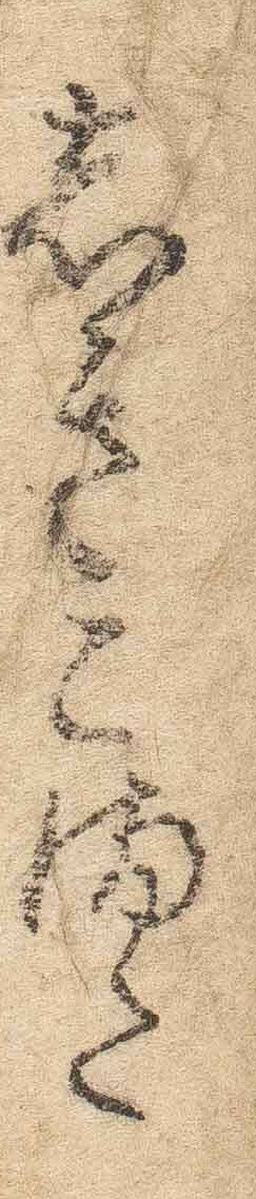しきこまた
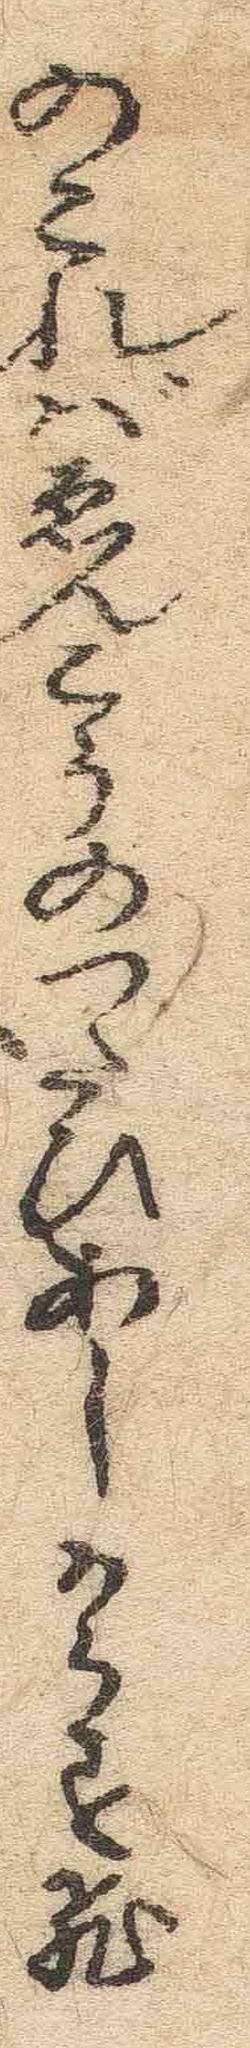のこればゑんこうのつたひあしからす飛
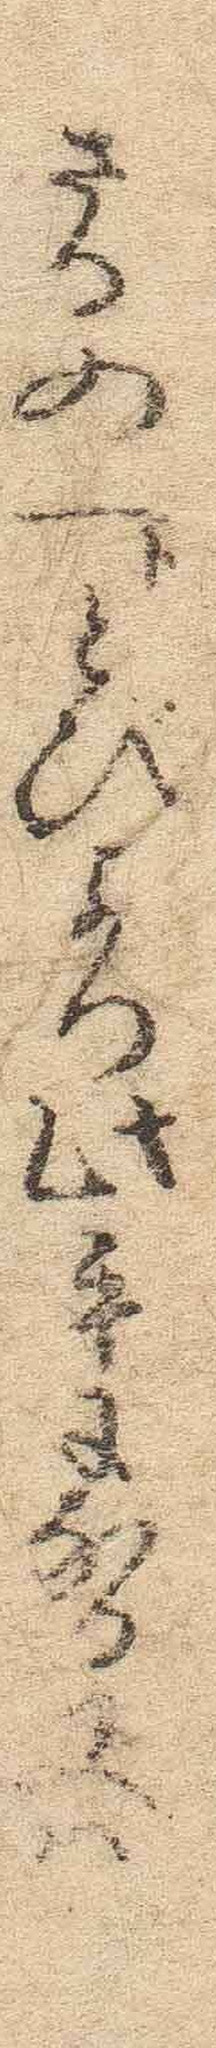さるの一とびより此手になる又は
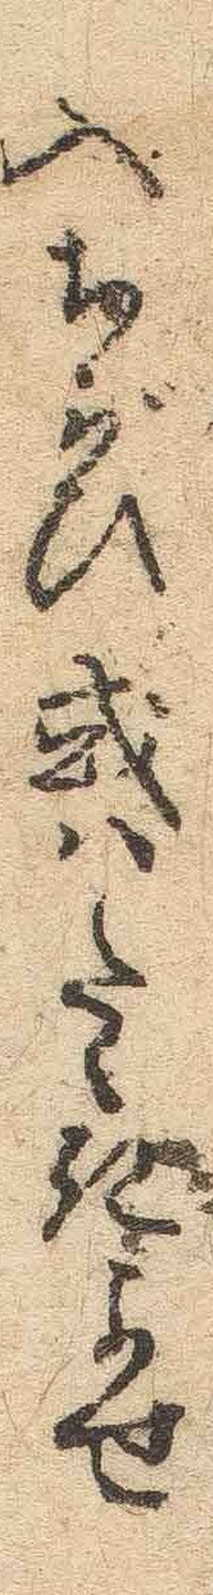入ちがひ或はたゝきよせ

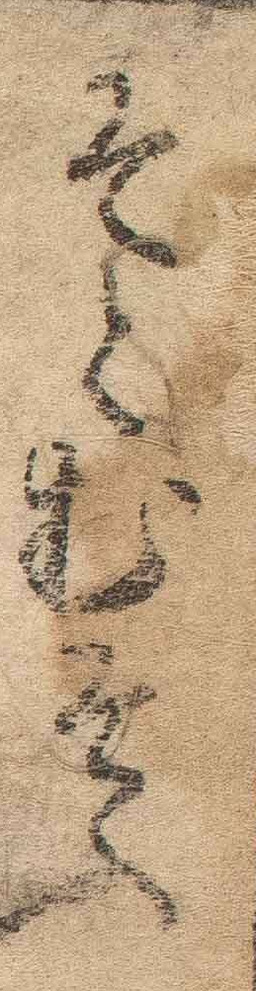そとむそふ
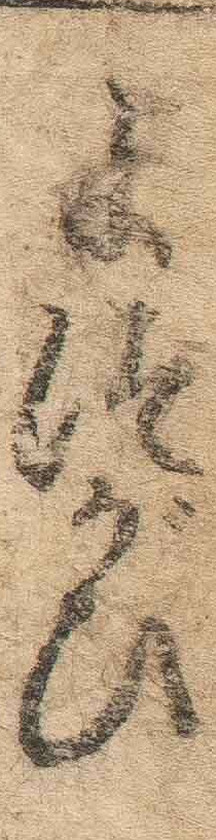よつがひ
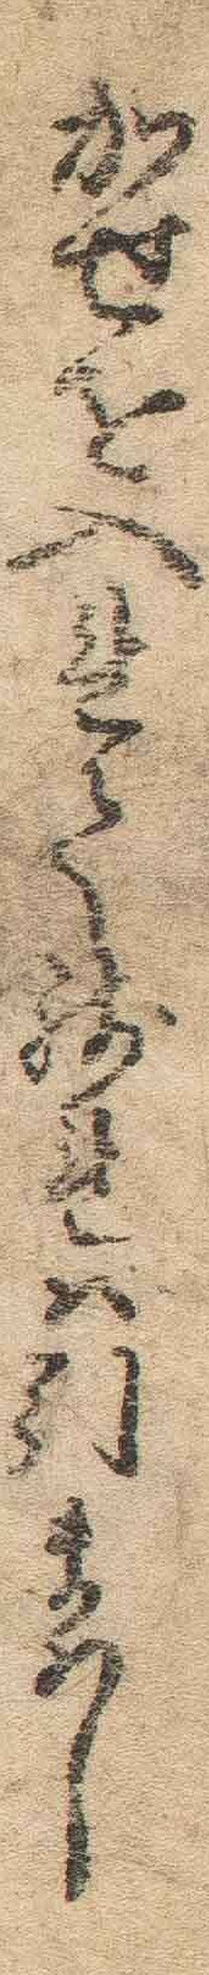かせを入れて残れば引まはし
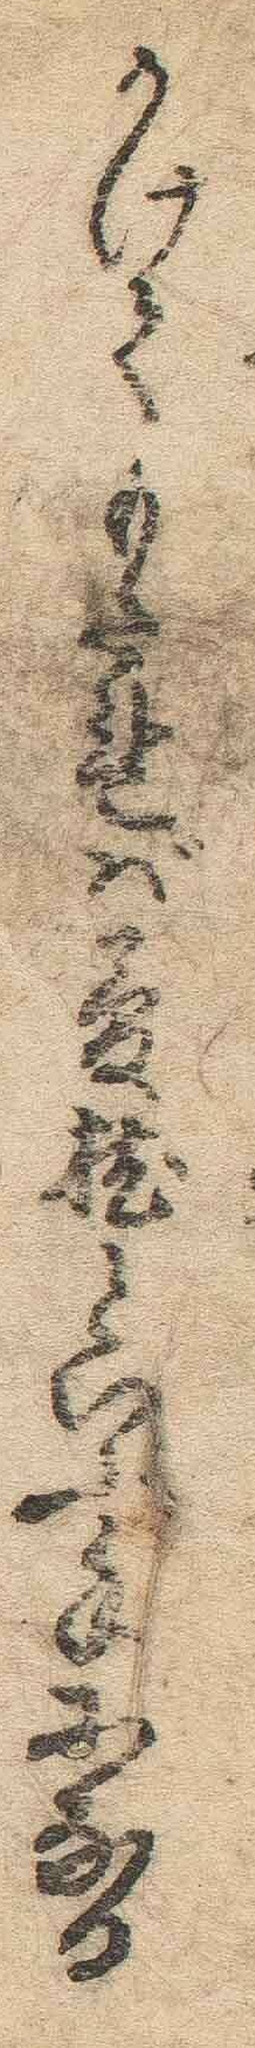かけてもたれば負龍といふ手になる
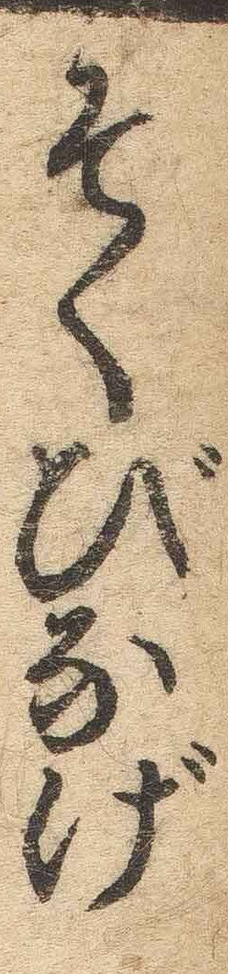そくびなげ
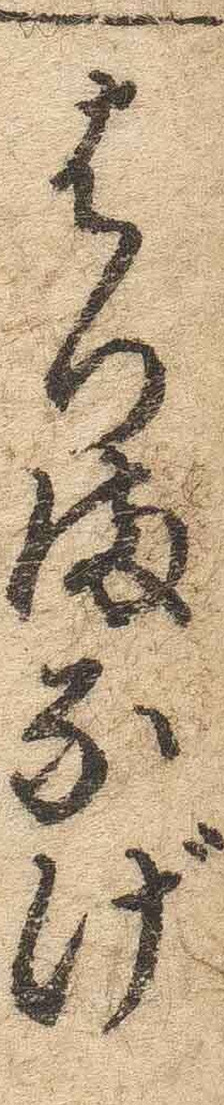はりまなげ
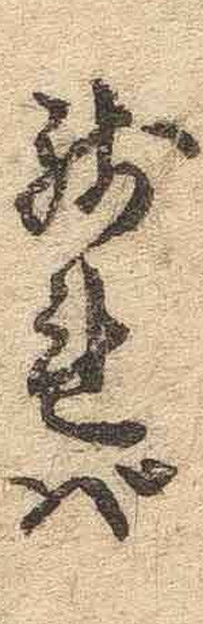残れば
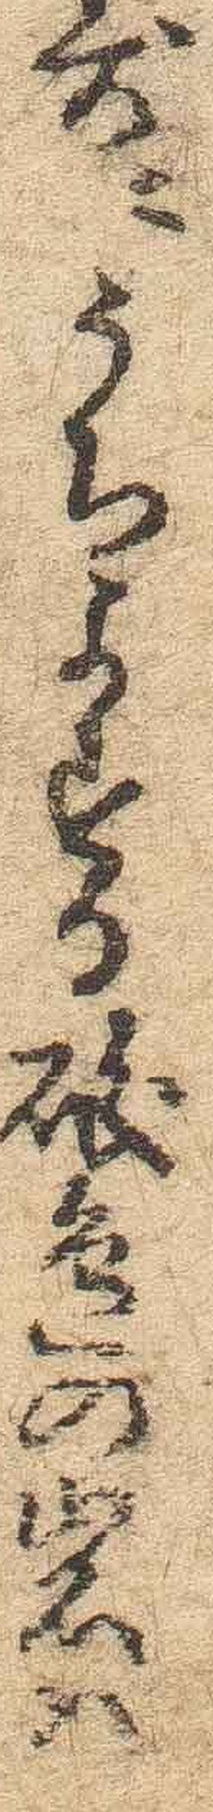哥にうちよする磯辺の岩は
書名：古今相撲大全
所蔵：東京学芸大学附属図書館 国文学研究資料館
